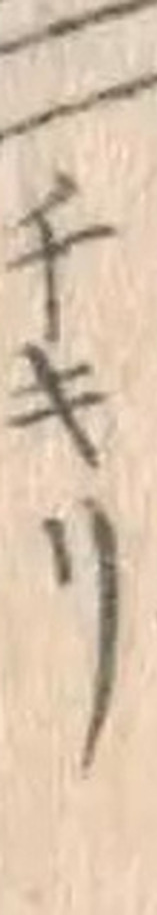チキリ

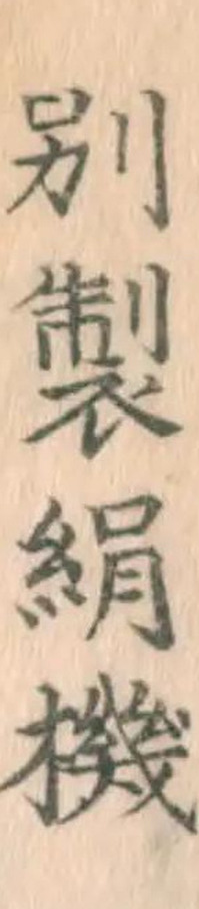別製絹機
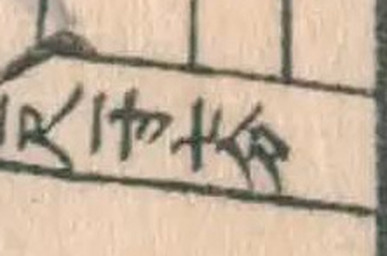一尺二寸二分
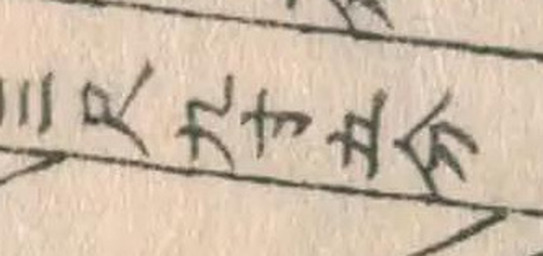三尺九寸五分
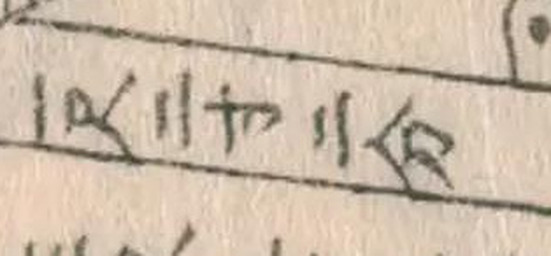一尺二寸二分

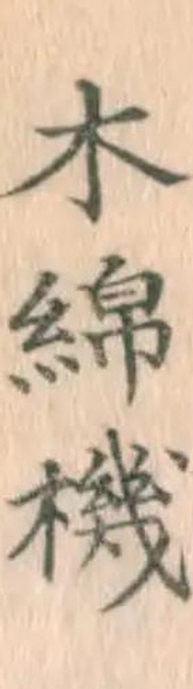木綿機
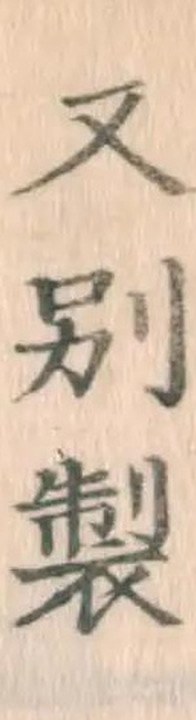又別製
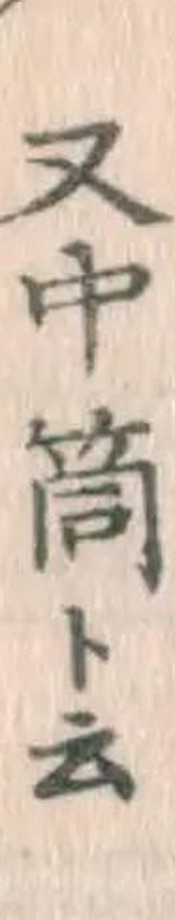又中筒ト云

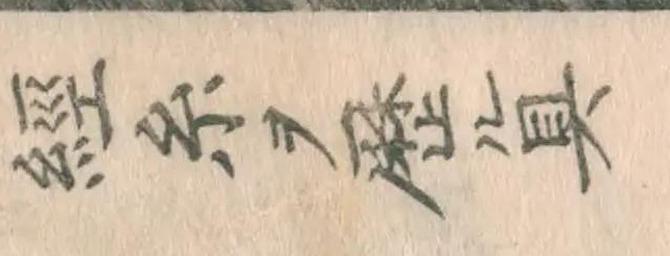経糸ヲ歴ル具

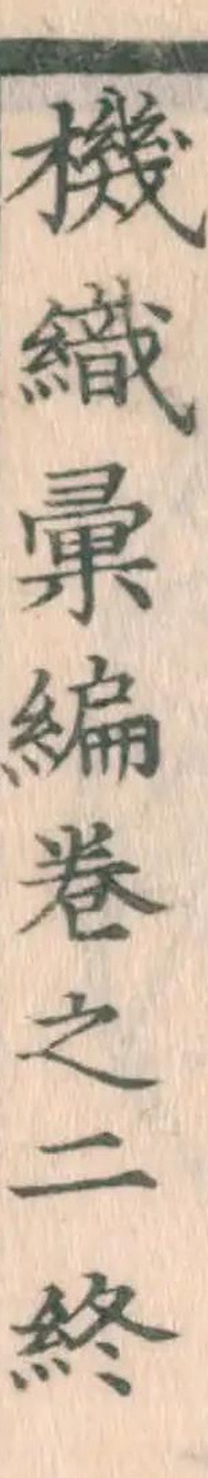機織彙編巻之二終
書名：機織彙編 5巻. [1]
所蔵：国立国会図書館 National Diet Library, JAPAN
